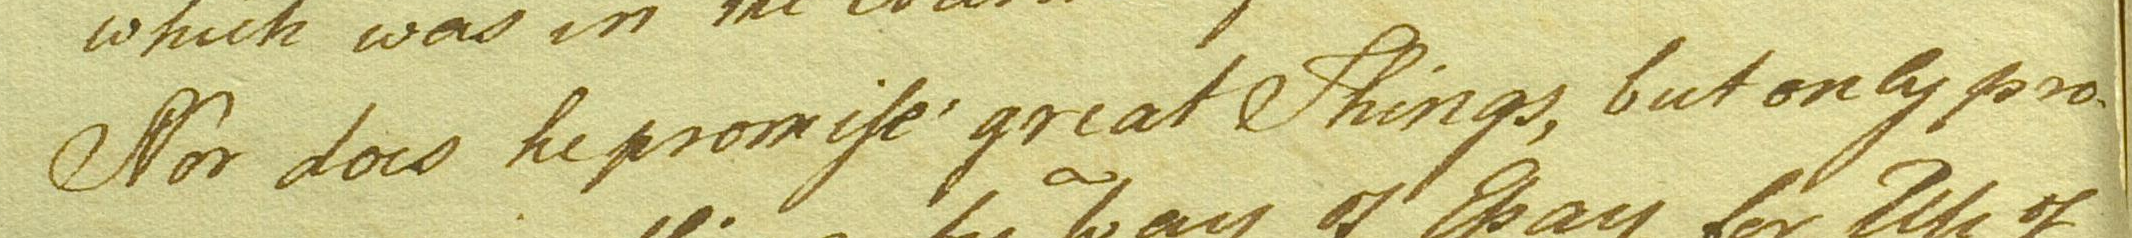Nor does he promise great Things, but only pro
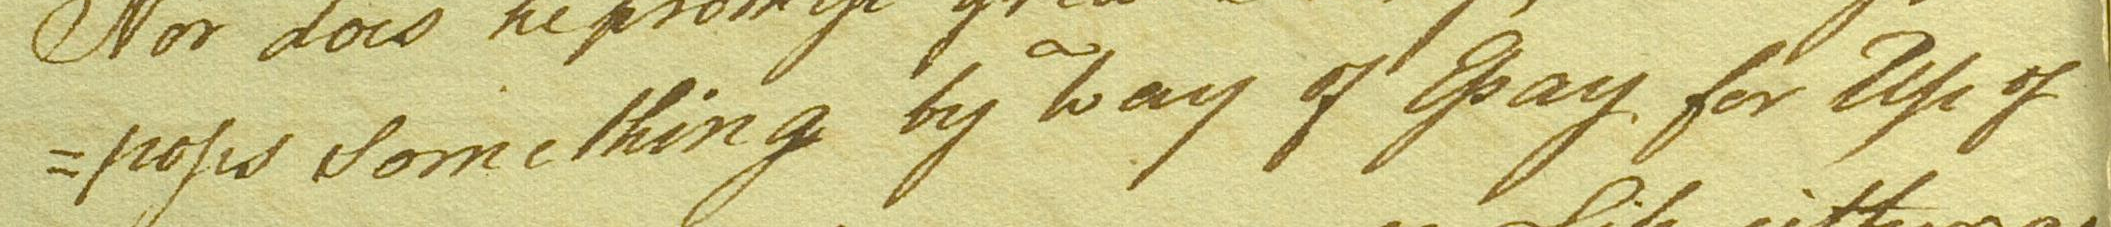-poses something by way of Essay for Use of
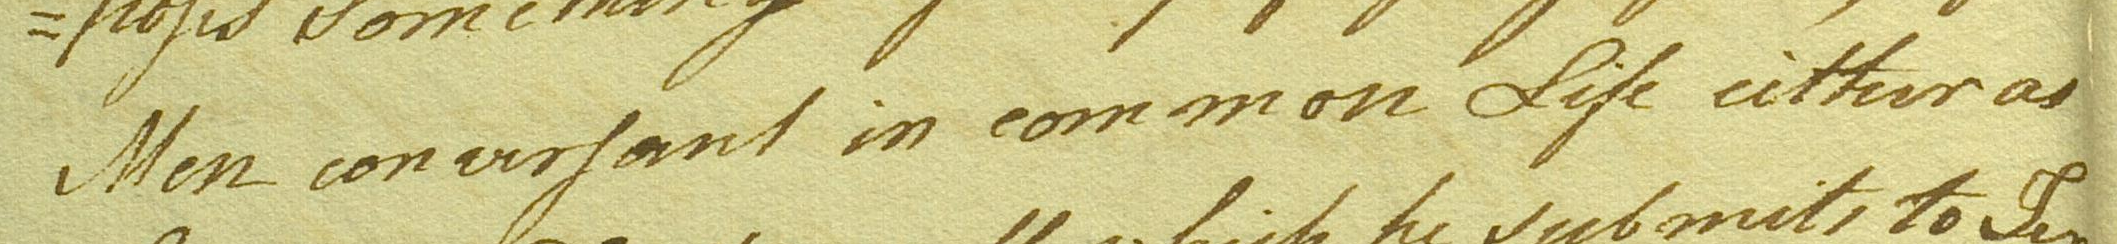Men conversant in common Life either as
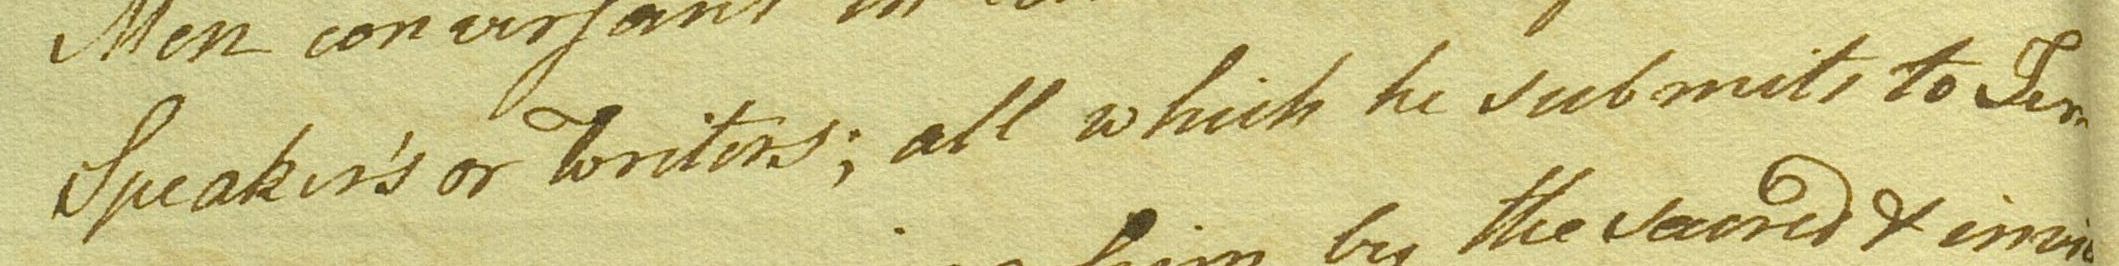Speaker's or Writers; all which he submit, to Ten
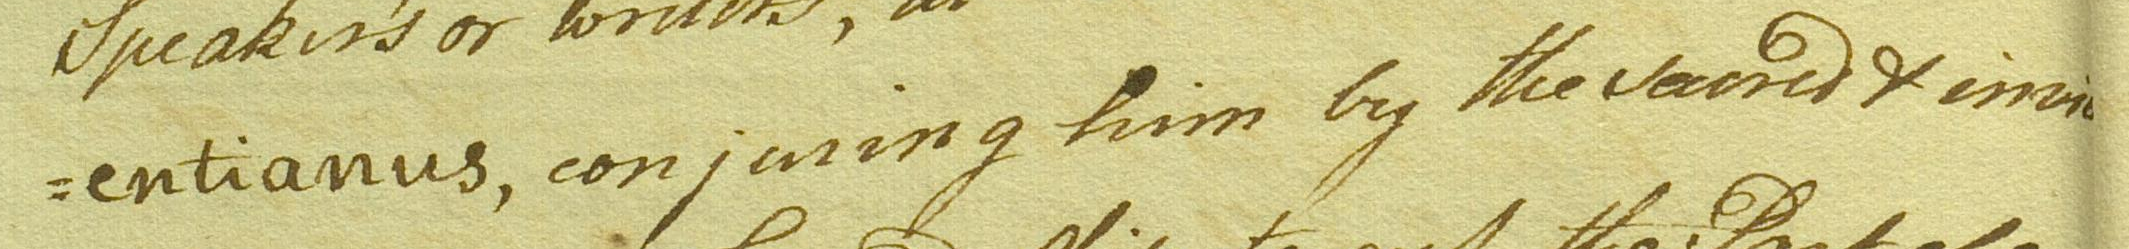-entianus, conjuring him by the sacred & invio
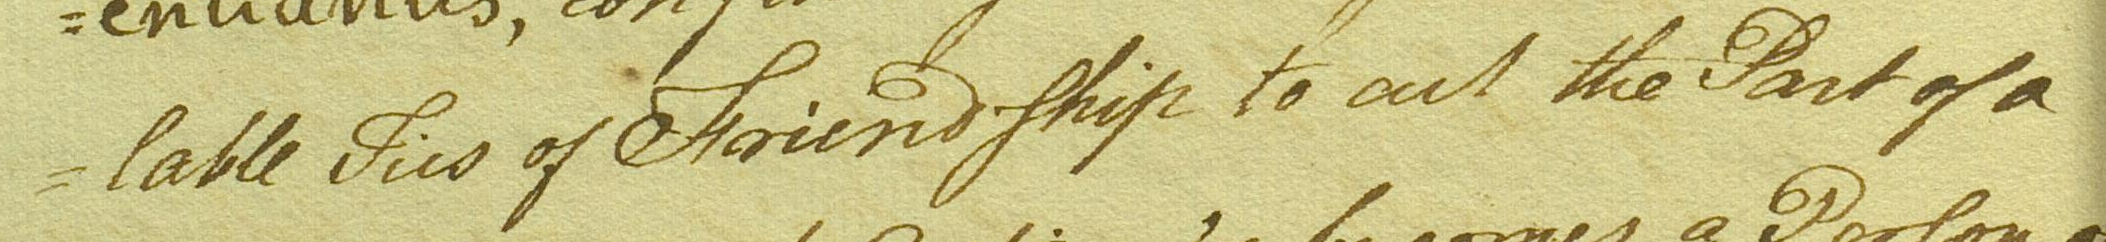-lable Ties of Friendship to act the Part of a
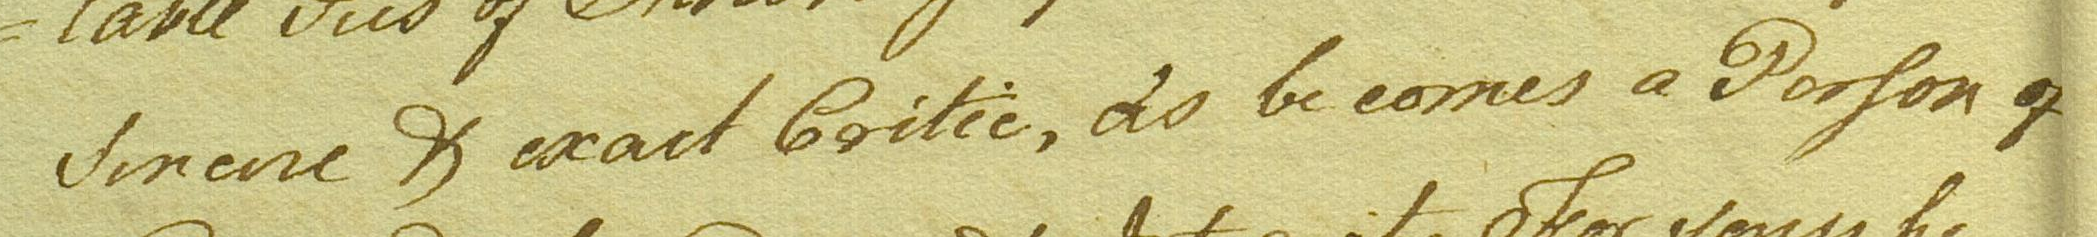Sincere & exact Critic, as becomes a Person of
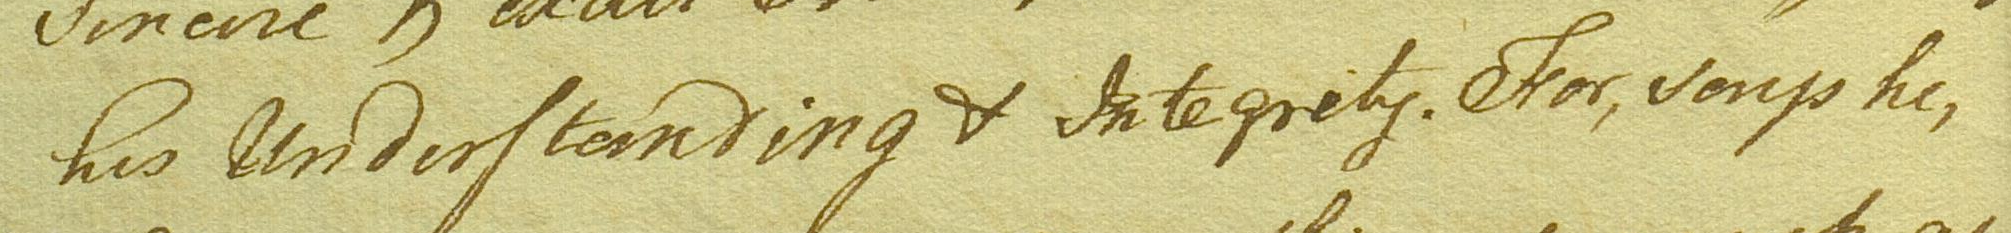his understanding & Integrity. For, says he,
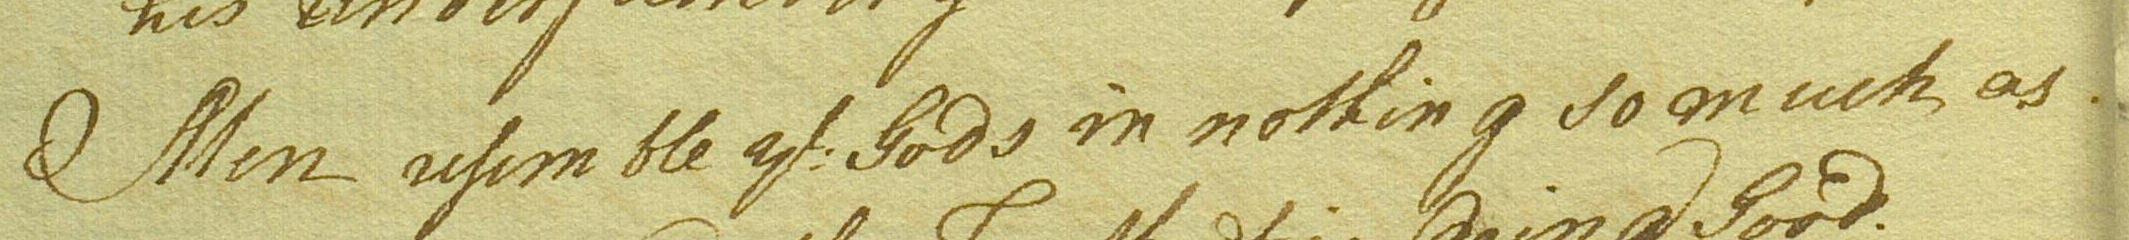Men resemble y^e: Gods in nothing so much as
